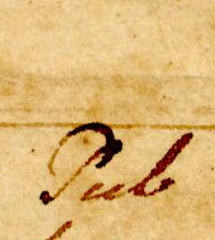Pub
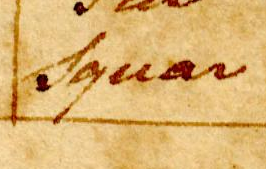square
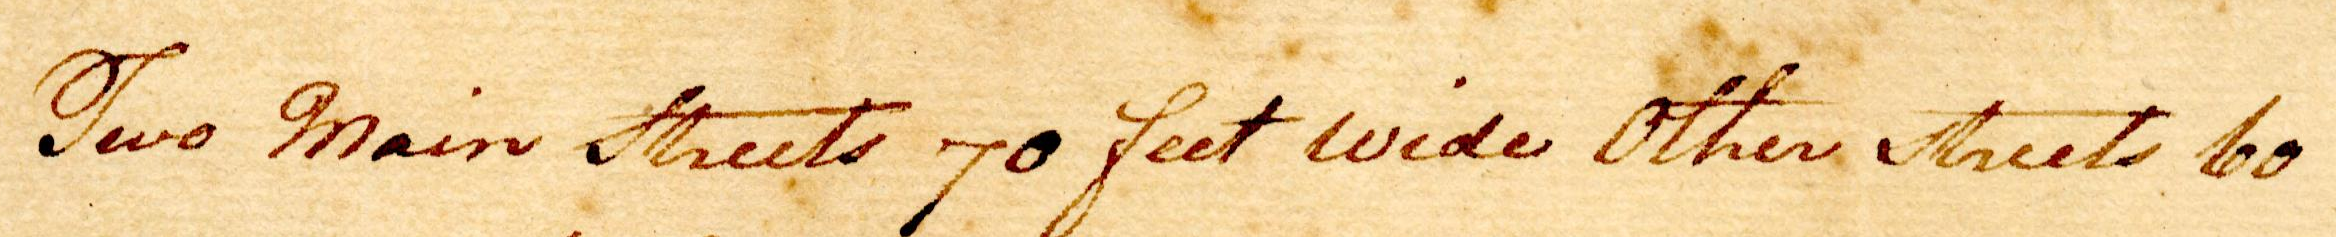Two Main Streets 70 feet wide Other streets 60
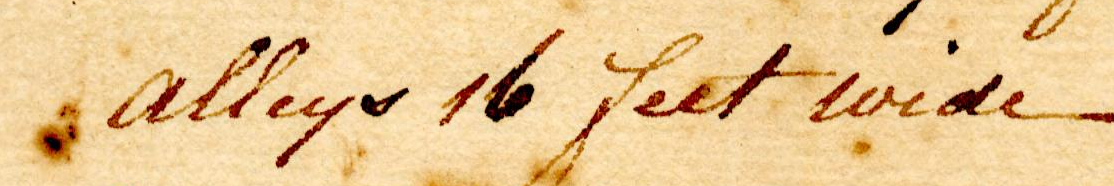Alleys 16 feet wide
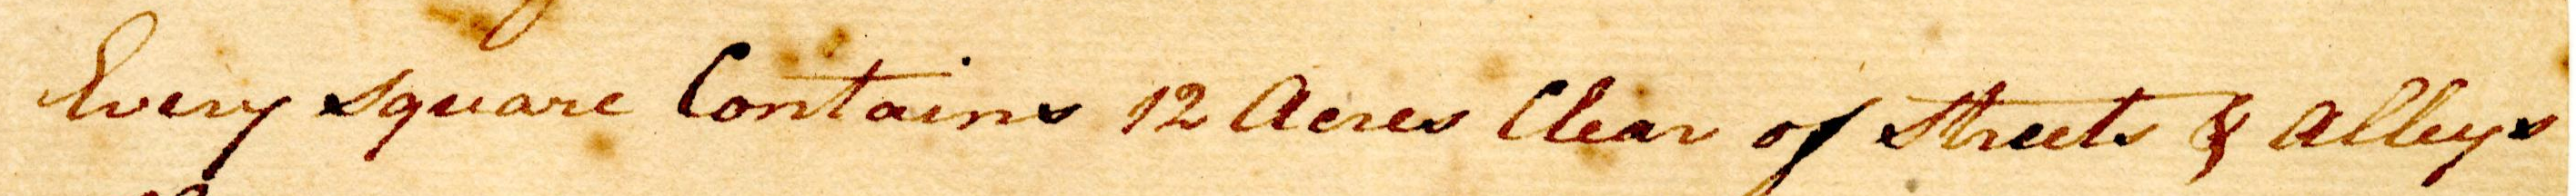Every square Contains 12 Acres Clear of Streets & Alleys
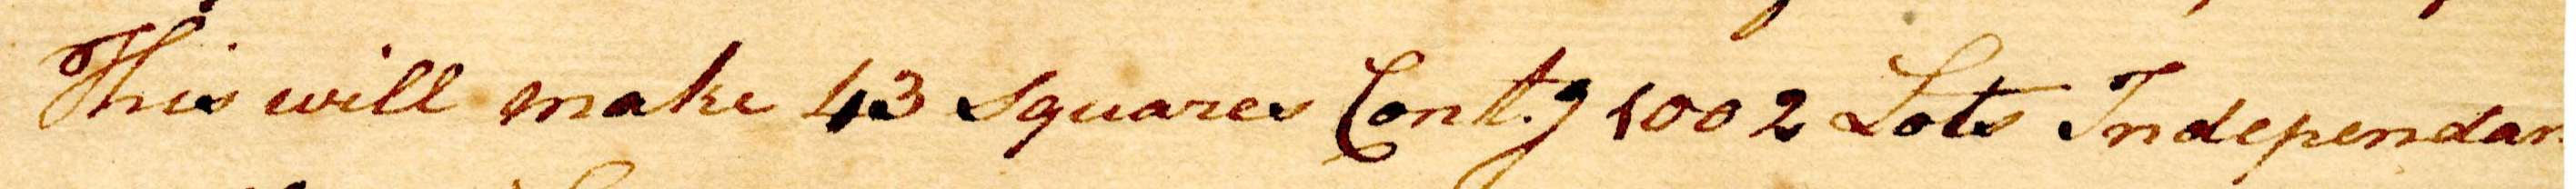This will make 43 squares Cont.^g 100 2 Lots Independent
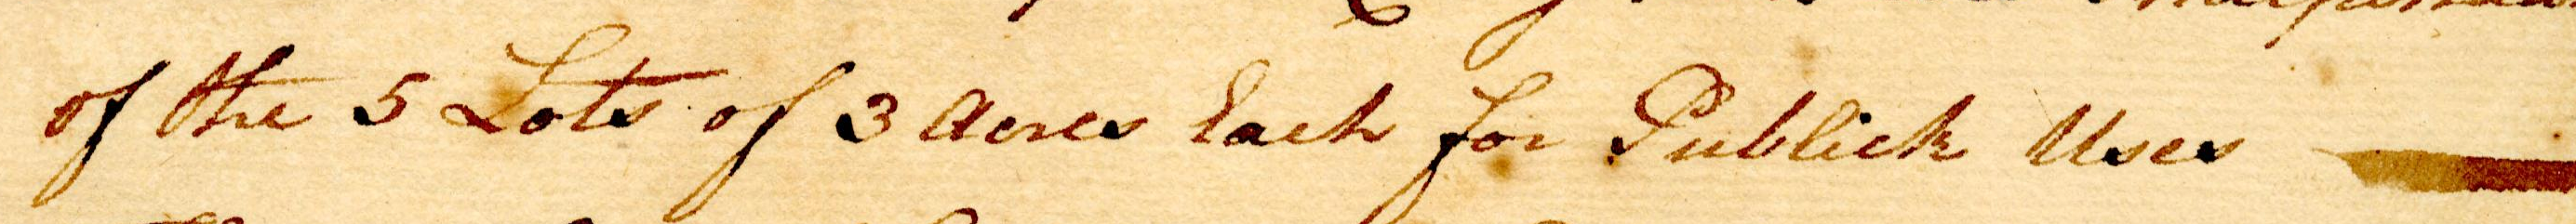of the 5 Lots of 3 acres Each for Publick User
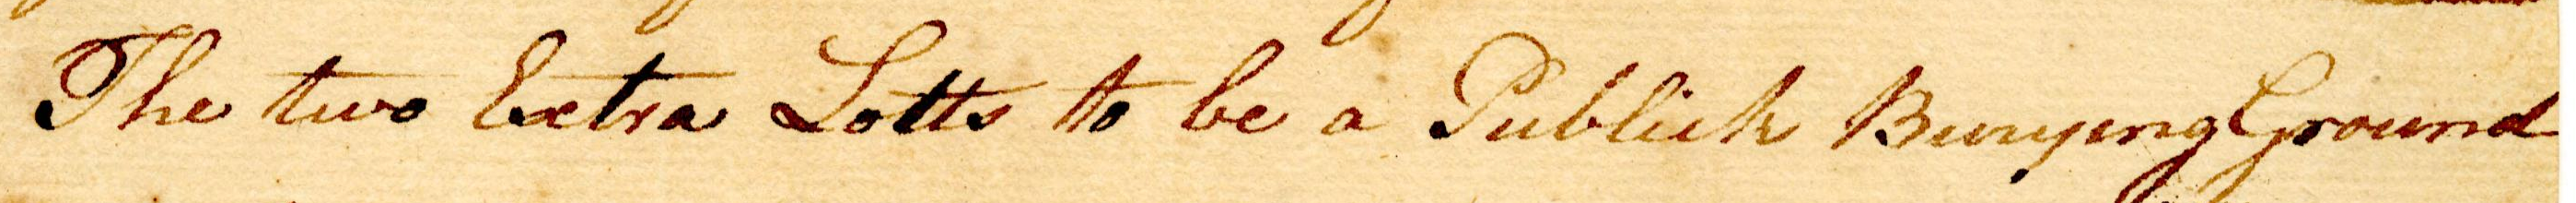The two extra Lotts to be a Publick Burying Ground
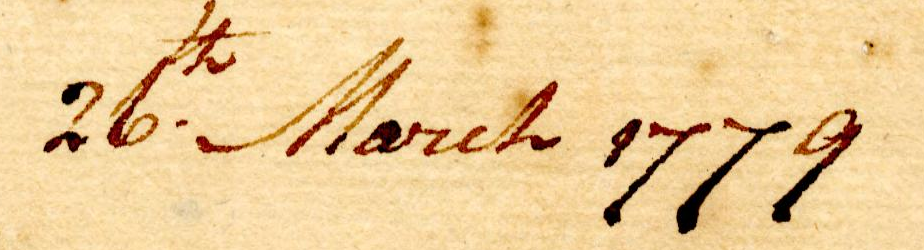26^th. March 1779
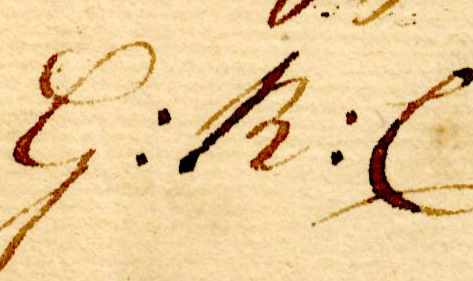G:R:C
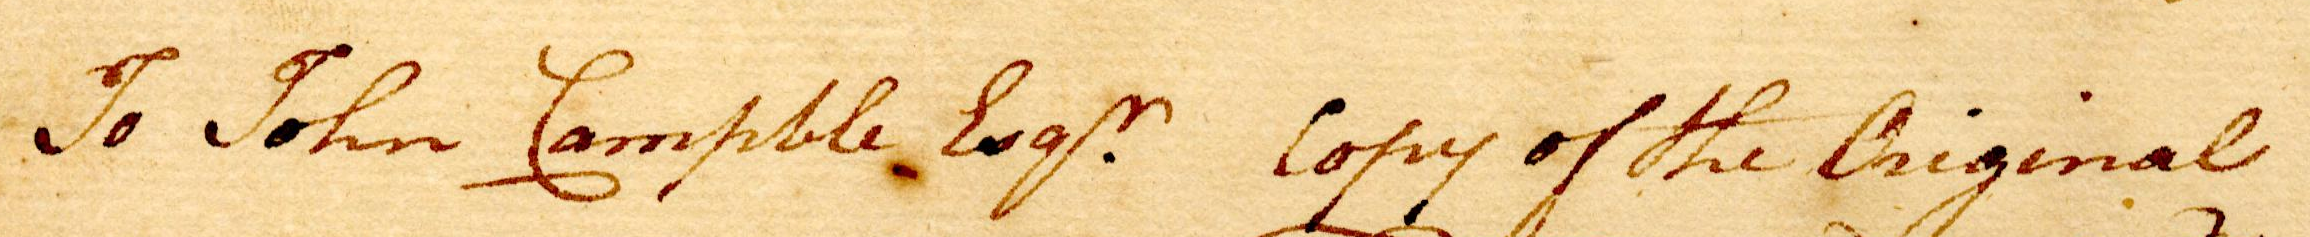To John Campble Esq^r. Copy of the Original
